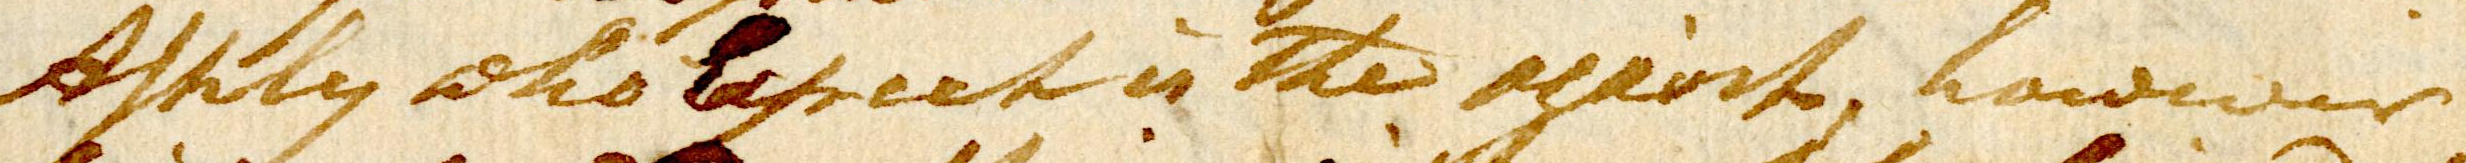Ashly who Expect is the against, however
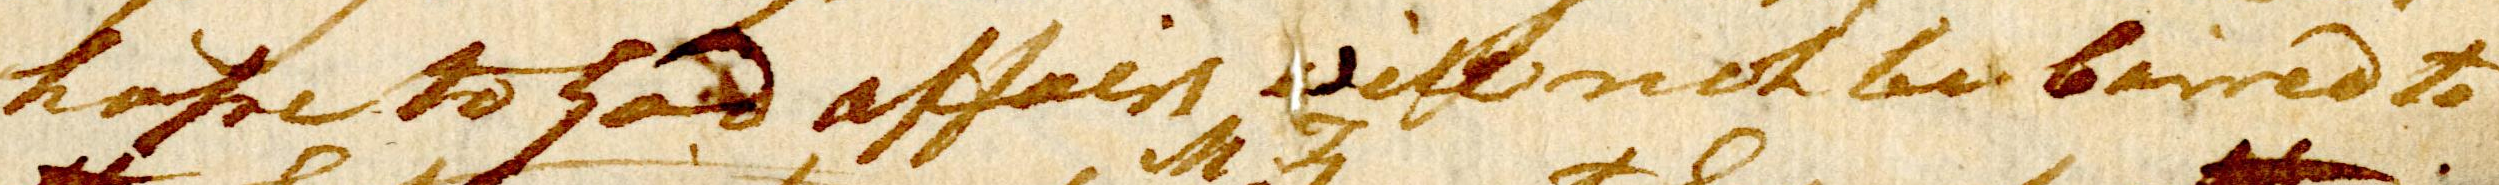hope to God affairs will not be Carried to
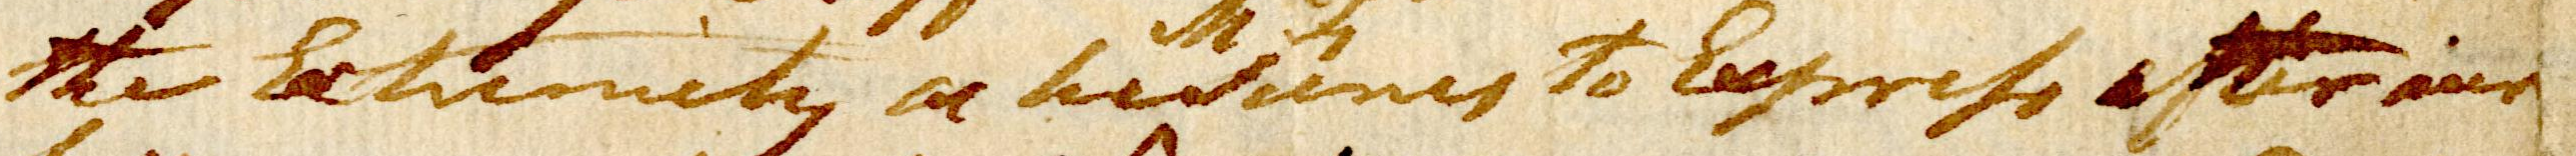the Extremity as heed any to Express after in
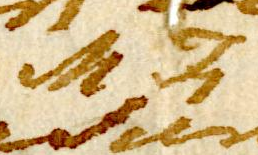M F
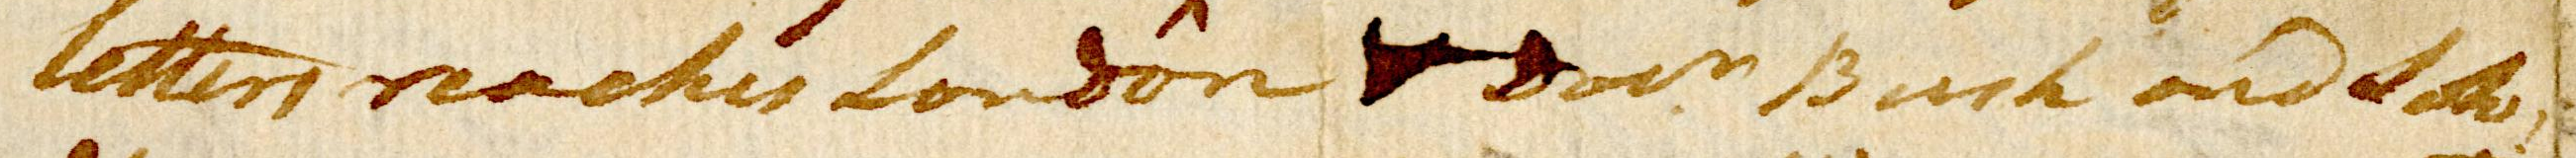letters reaches London & Doc^r Bush and Loks
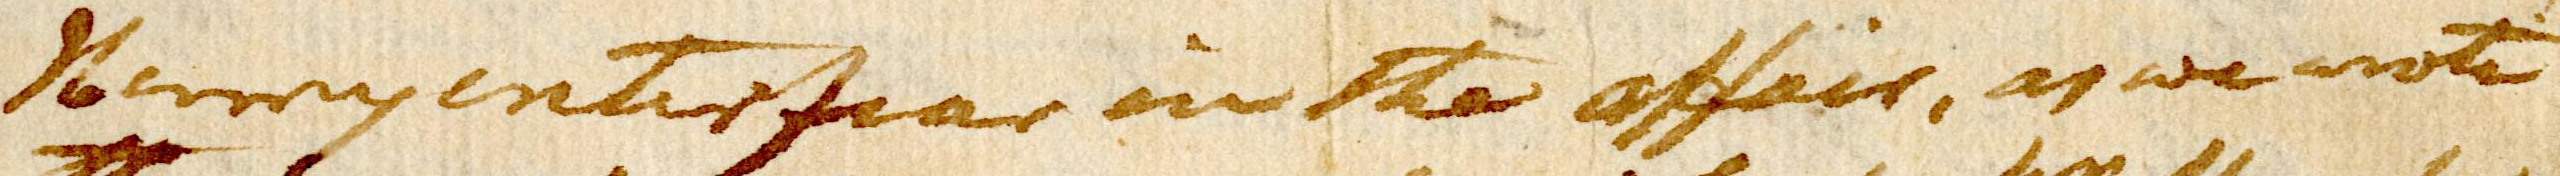Harry enterfear in the affair, as we wrote
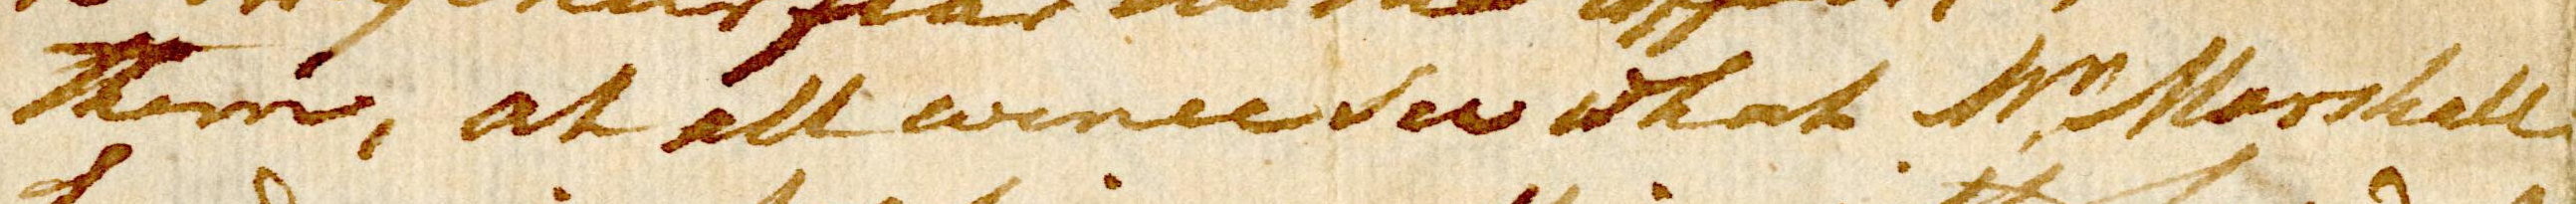them, at all we nee see what M^r. Marshall
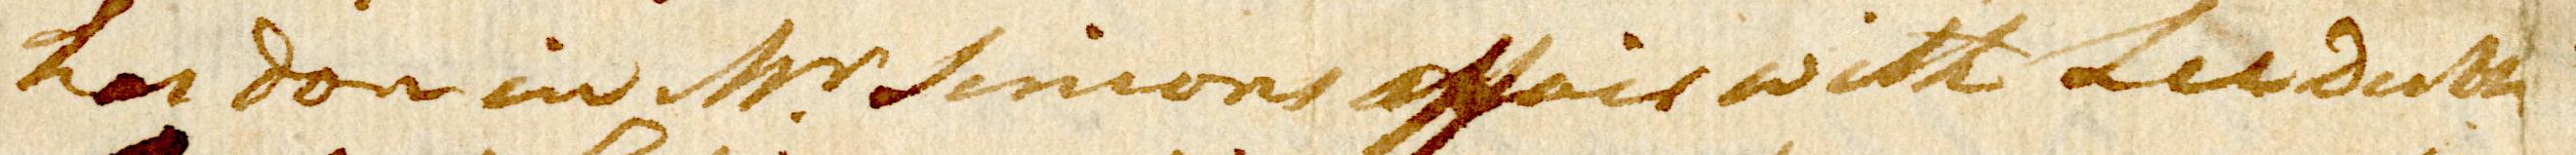has done in M^r Simons affairs with Lee Dub
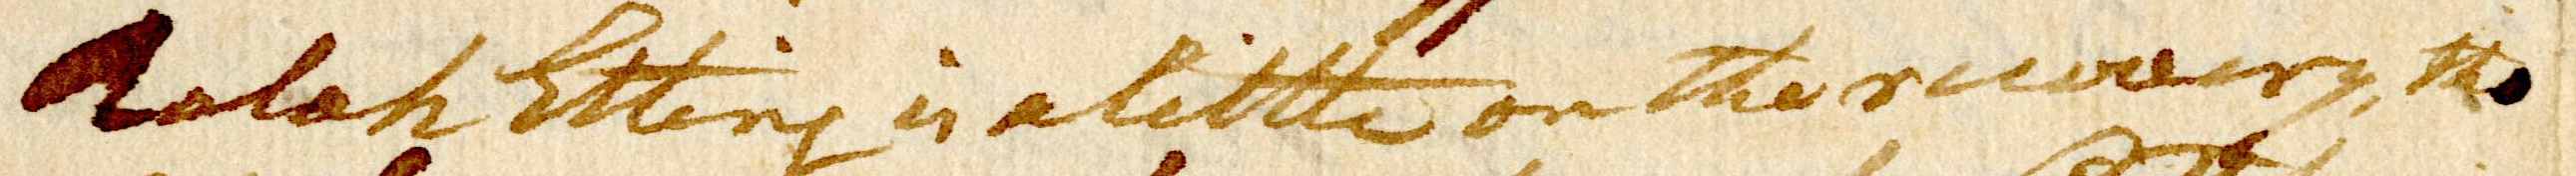Ralah Etting is a little on the receiver, tho
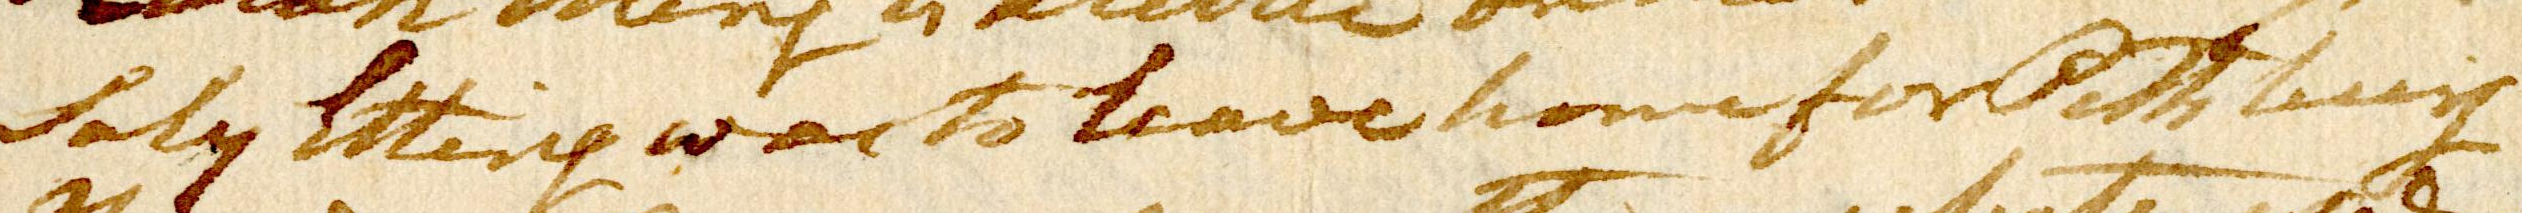Saly Etting was to leave home for Pittsburg
